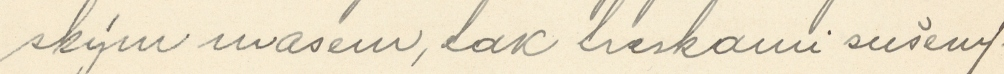ským masem, tak treskami sušený-
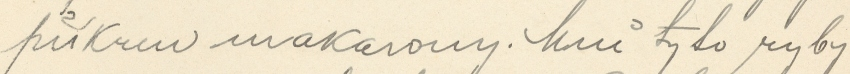příkrm makarony. Mně tyto ryby
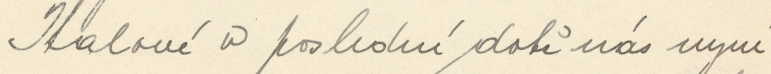Italové v poslední době nás nyní
